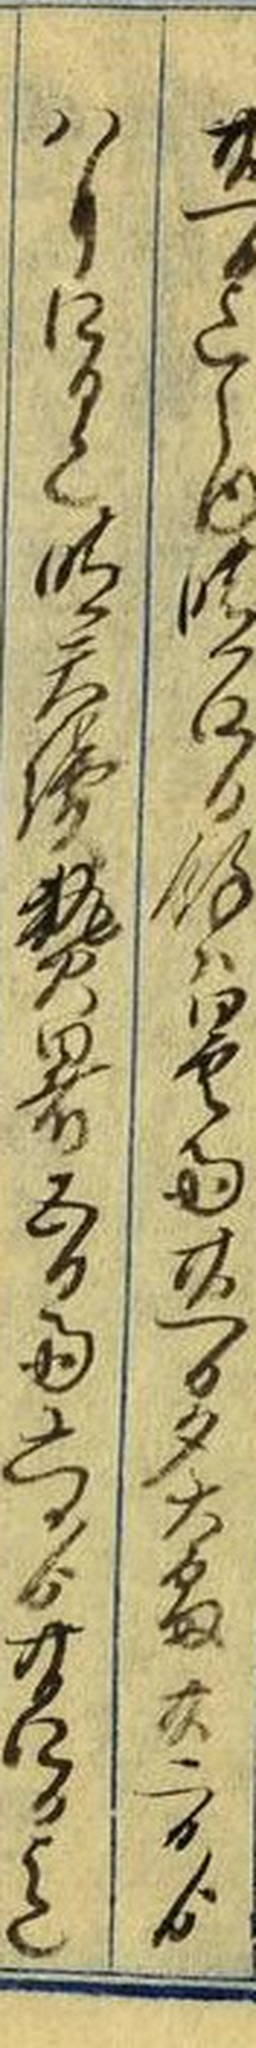八月四日迄晴天続熱暑五日雨六日ゟ廿四日迄
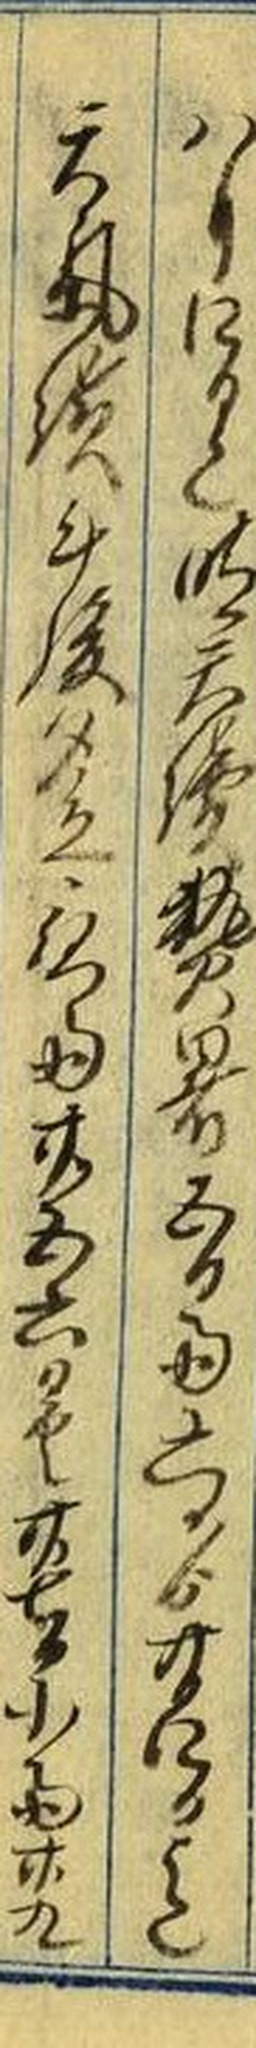天気続午後夕立夜雨廿五六曇廿七日小雨廿九
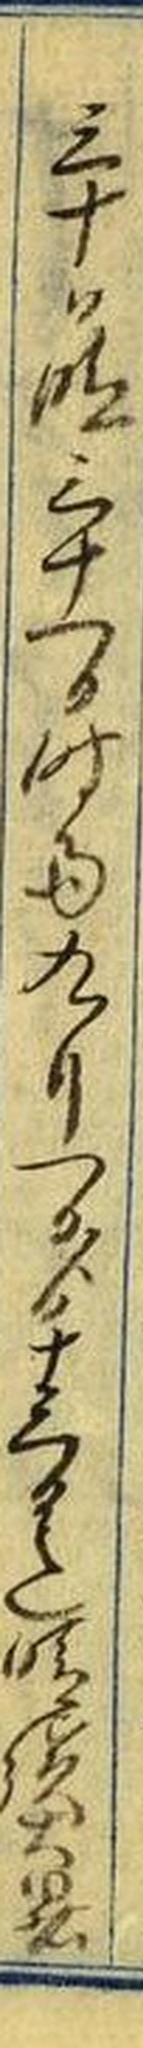三十日晴三十一日時雨九月一日ゟ十三日迄晴続大暑
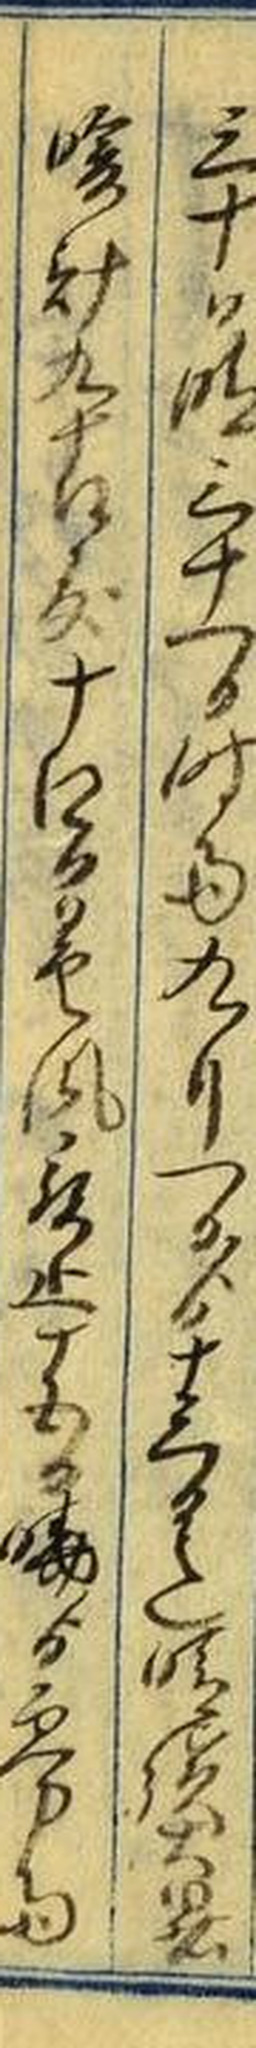暖計九十四度十四日曇風夜止十五日暁ゟ夕方雨
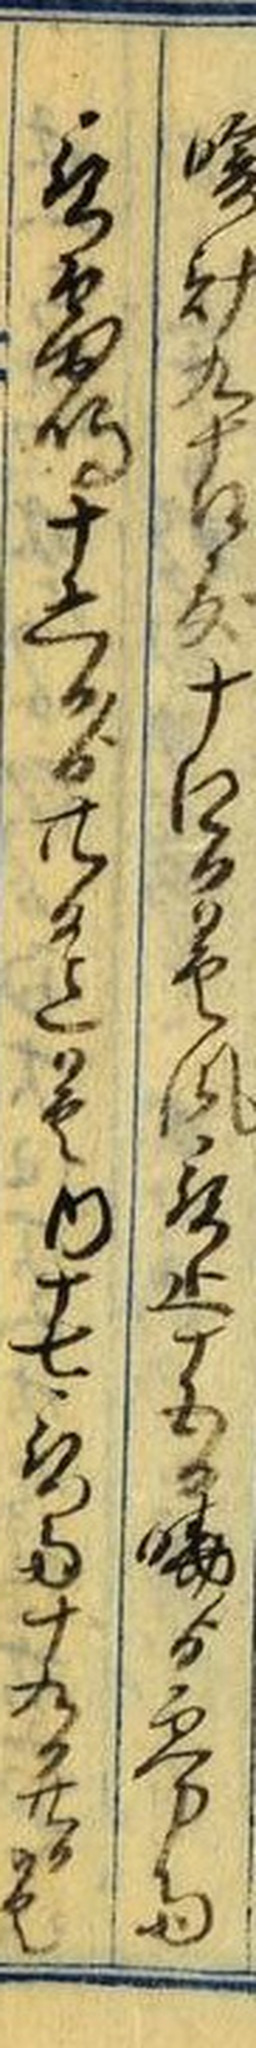夜雷鳴十六日ゟ廿日迄曇内十七夜雨十九日廿日曇

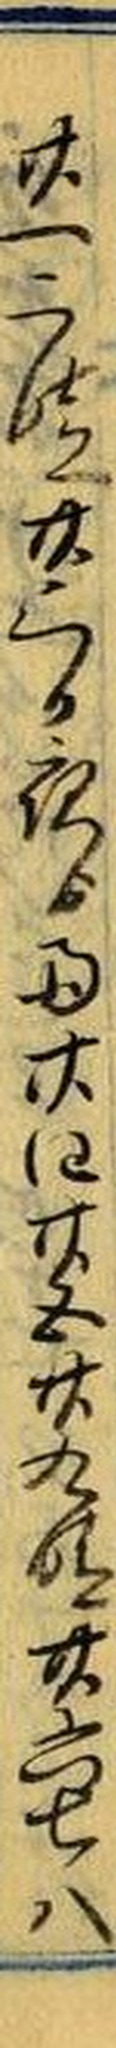廿一二晴廿三日夜ゟ雨廿四廿五廿九晴廿六七八
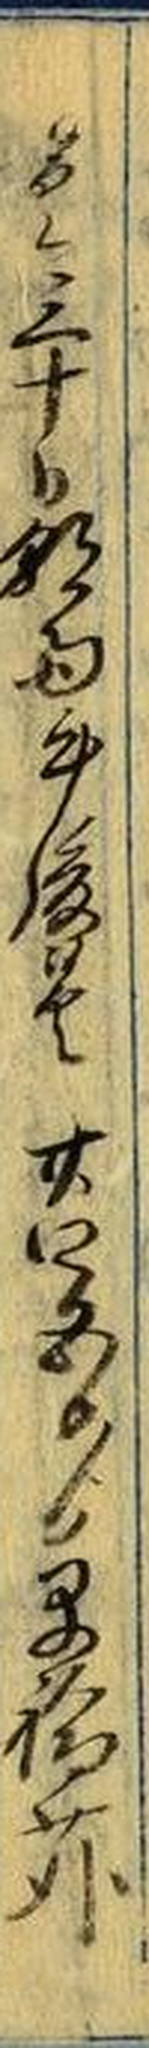曇三十日朝雨午後曇廿四五日ゟ早稲苅
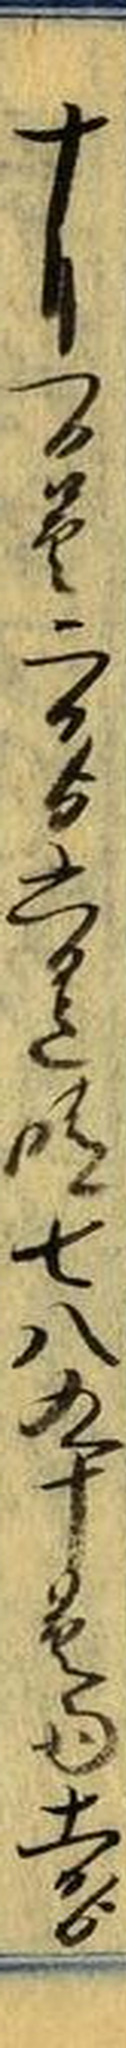十月一日曇二日ゟ六日迄晴七八九十曇雨十一日ゟ
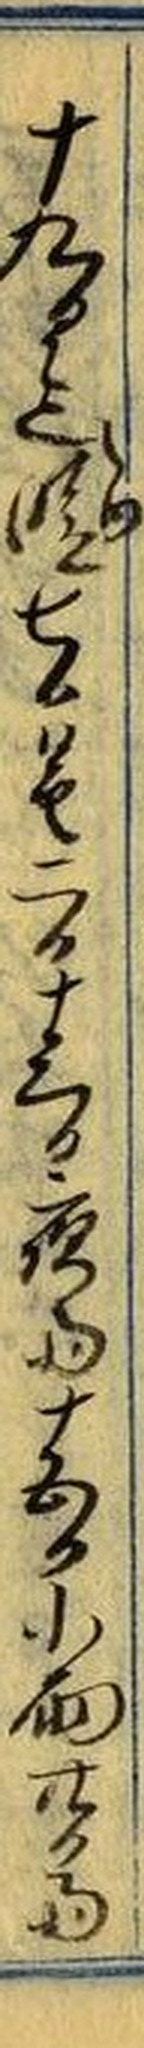十九日迄之内晴七日曇二日十三日夜雨十五日小雨廿日雨
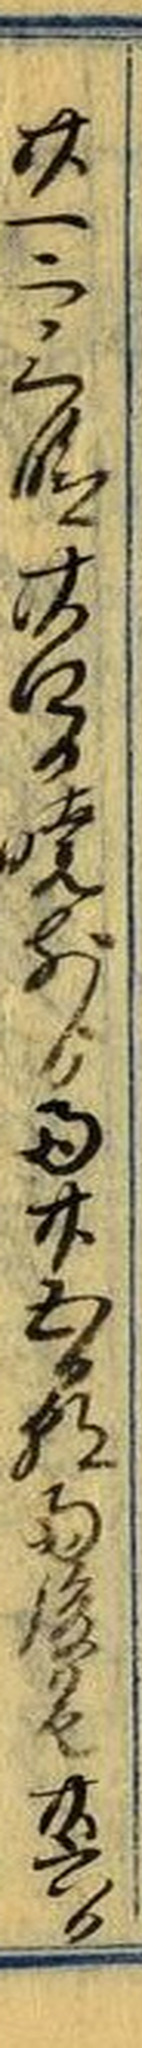廿一二三晴廿四日暁前ゟ雨廿五日朝雨後曇廿六日
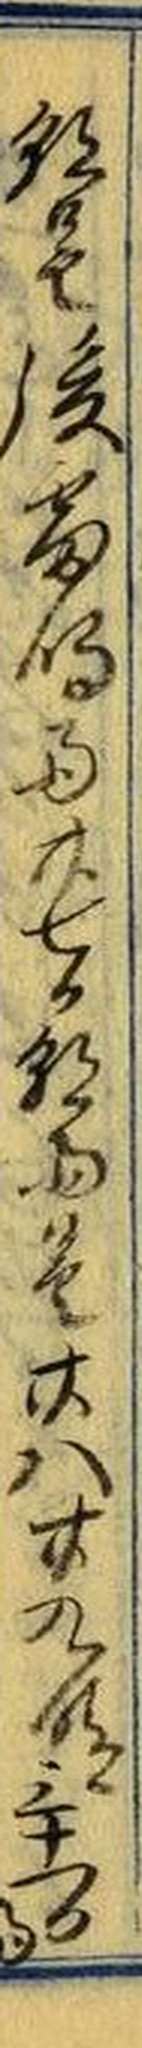朝曇後雷鳴雨廿七日朝雨曇廿八廿九晴三十一日雨
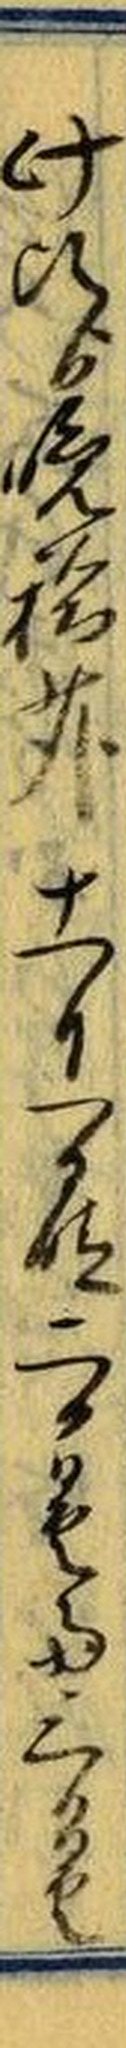此頃ゟ晩稲苅十一月一日晴二日曇雨三日曇
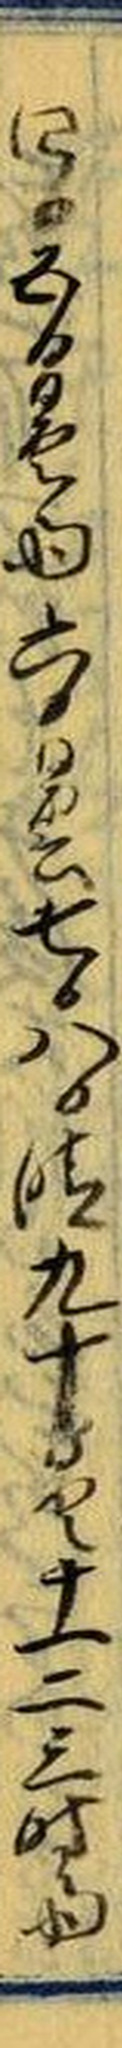四日五日曇雨六日曇七日八日晴九十曇十一二三時雨
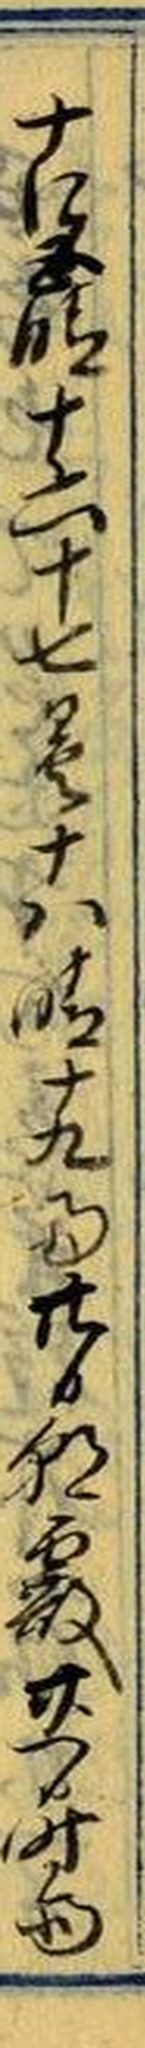十四五晴十六十七曇十八晴十九雨廿日朝霧廿一日時雨
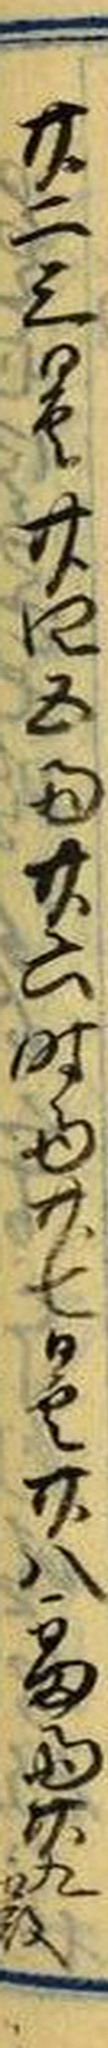廿二三曇廿四五雨廿六時雨廿七曇廿八雷雨廿九霧
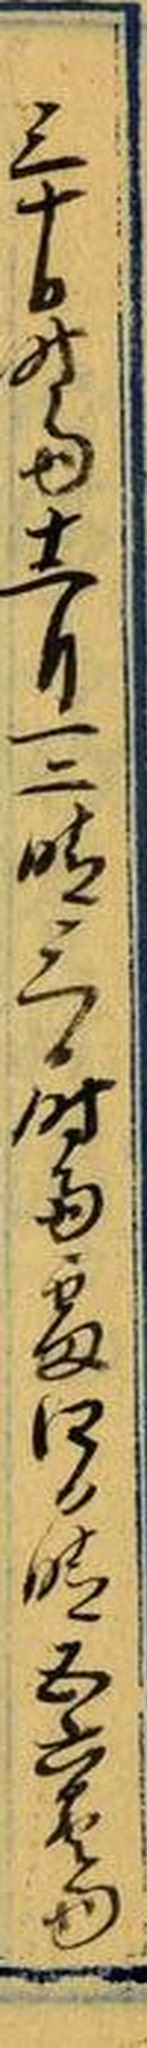三十日時雨十二月一二晴三日時雨雷四日晴五六曇雨
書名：温古集 五巻
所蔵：福井県文書館 Fukui Prefectural Archives
